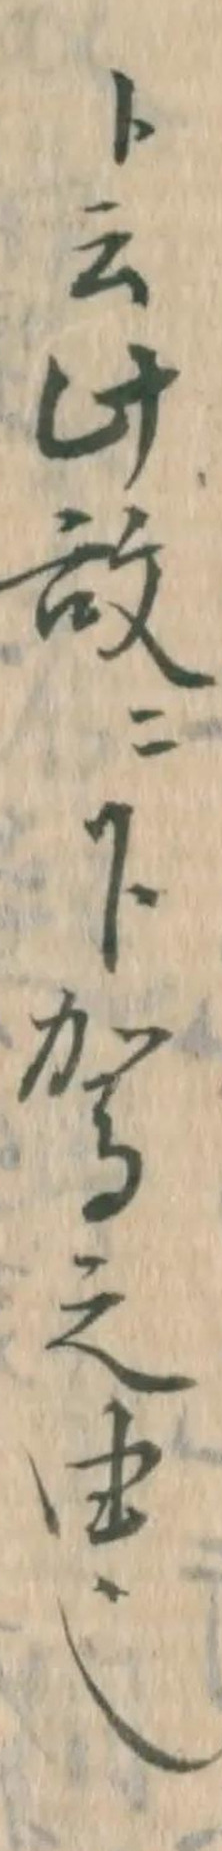ト云此故ニ下駕之由也
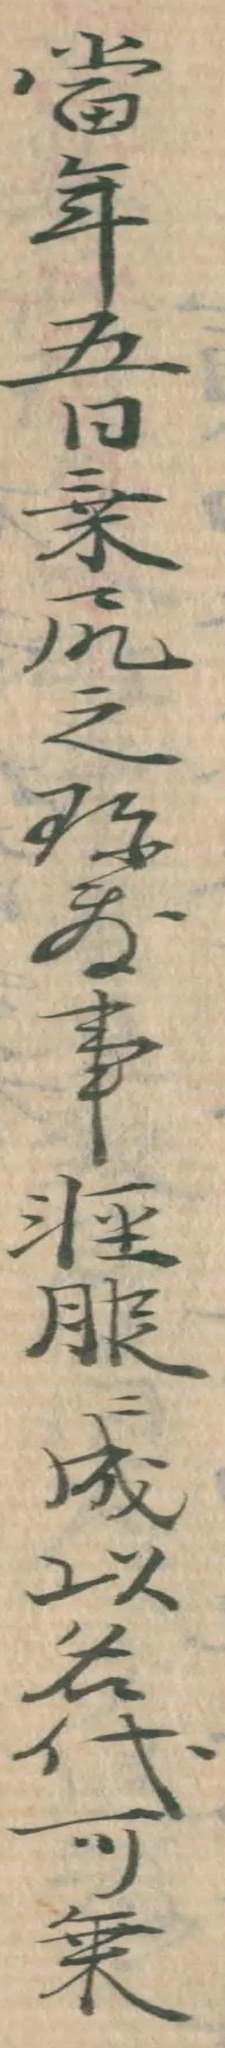当年五日乗尻之珍敷事軽服ニ成以名代可乗
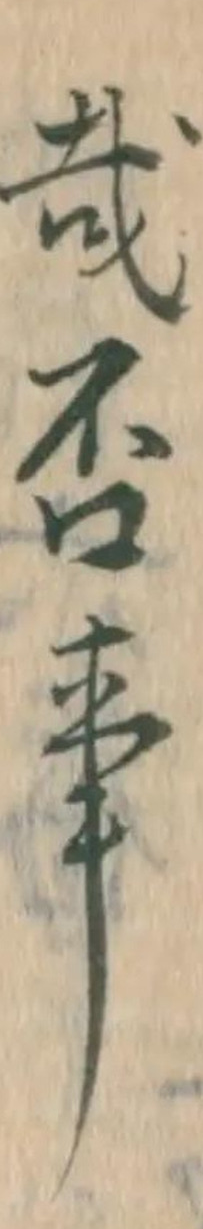哉否事
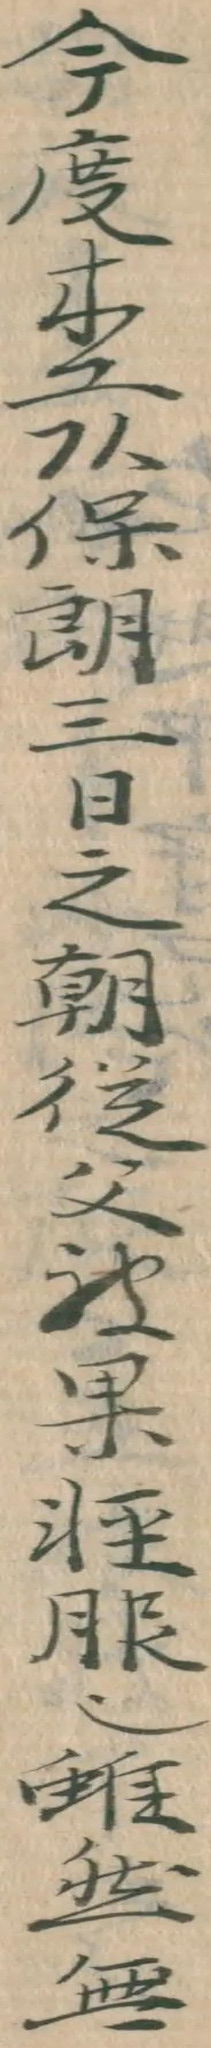今度木工頭保朗三日之朝従父被果軽服也雖然無
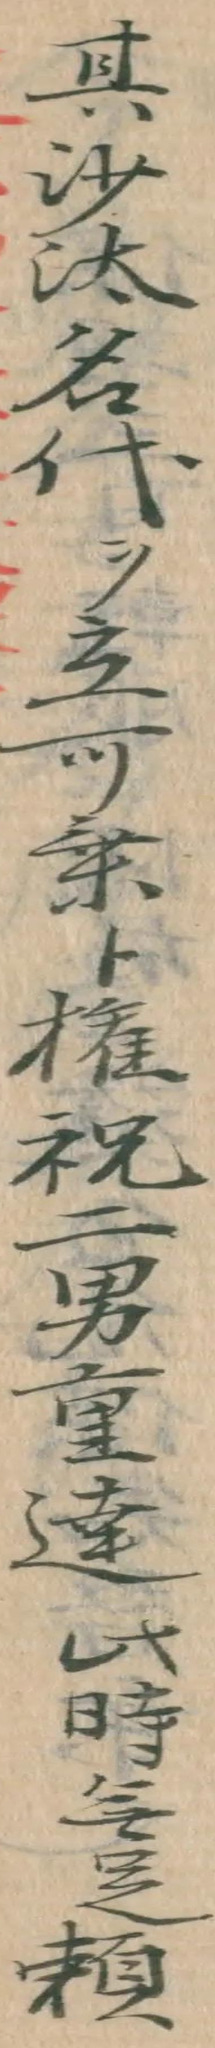其沙汰名代ヲ立可乗ト権祝二男重達此時無足頼
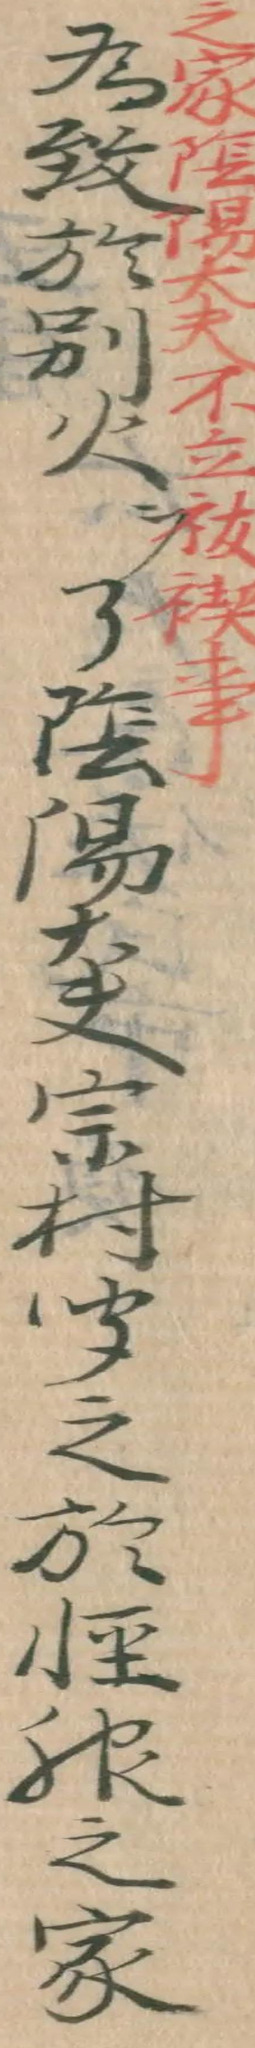為致於別火ヲ了陰陽大夫宗村聞之於軽服之家
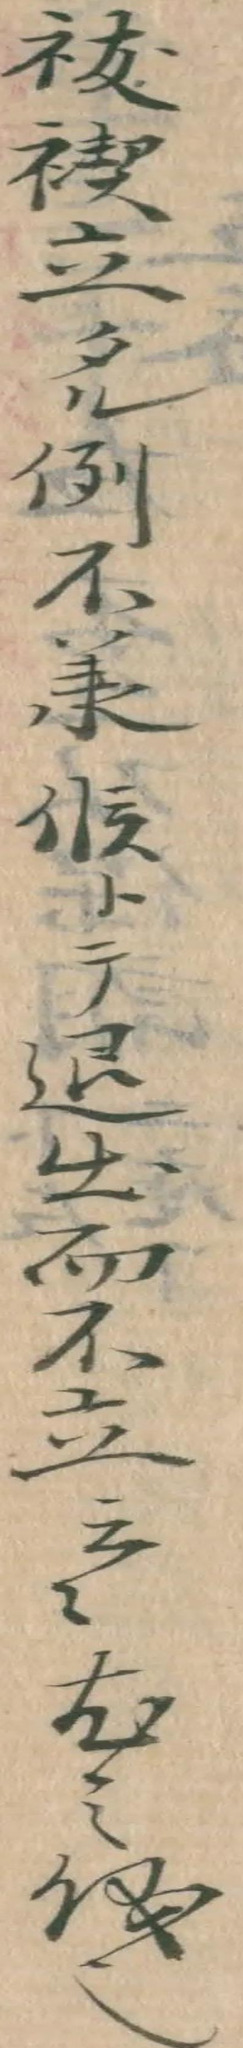祓禊立タル例不承候トテ退出而不立云々尤之儀也
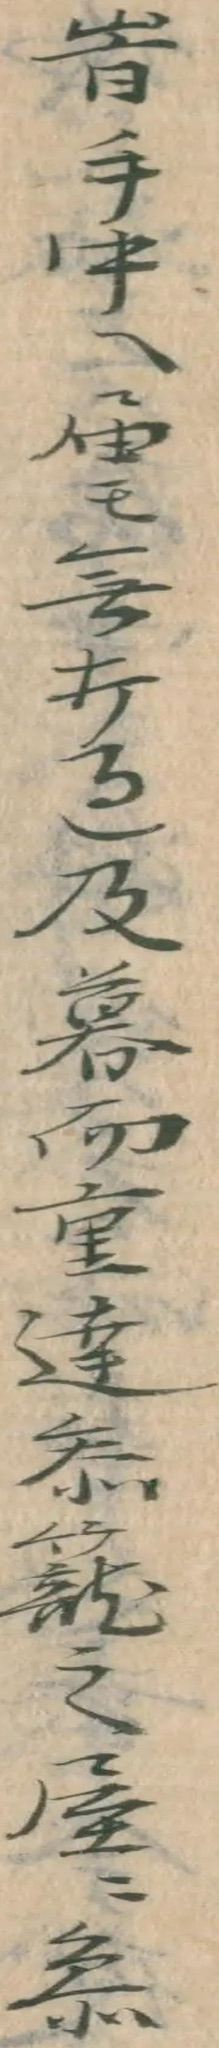旹手中ヘ届モ無打過及暮而重達参籠之屋ニ参
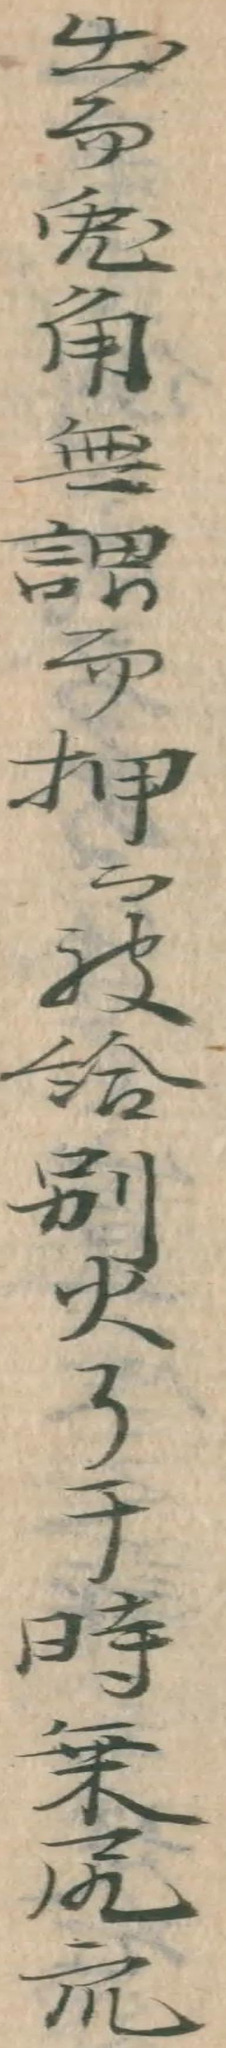出而兎角無謂而押而被給別火了于時乗尻衆
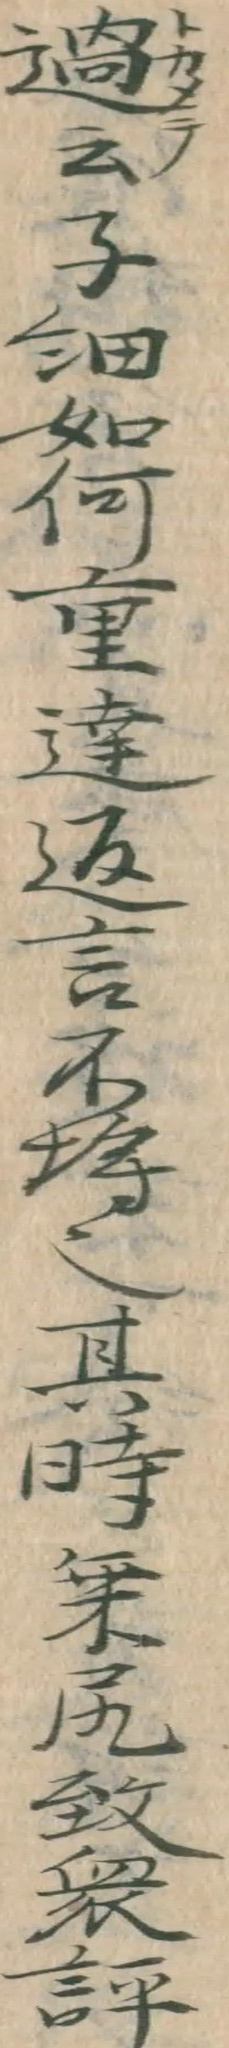過云子細如何重達返言不埒也其時乗尻致衆評
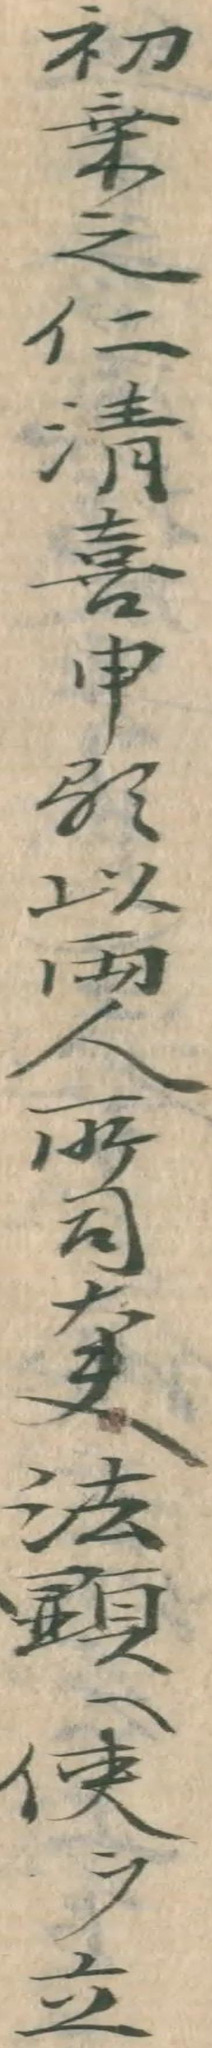初乗之仁清喜申顕以両人所司大夫法顕ヘ使ヲ立
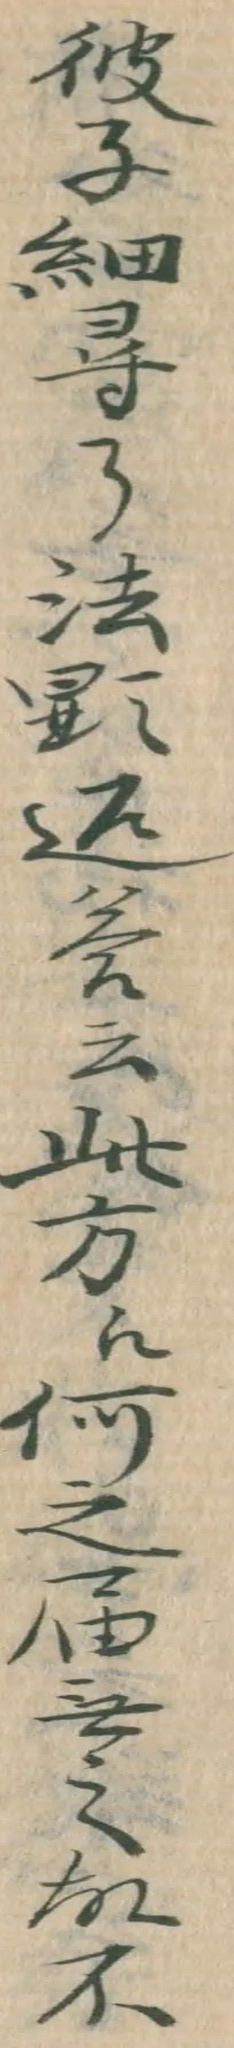彼子細尋了法顕返答云此方江何之届無之故不
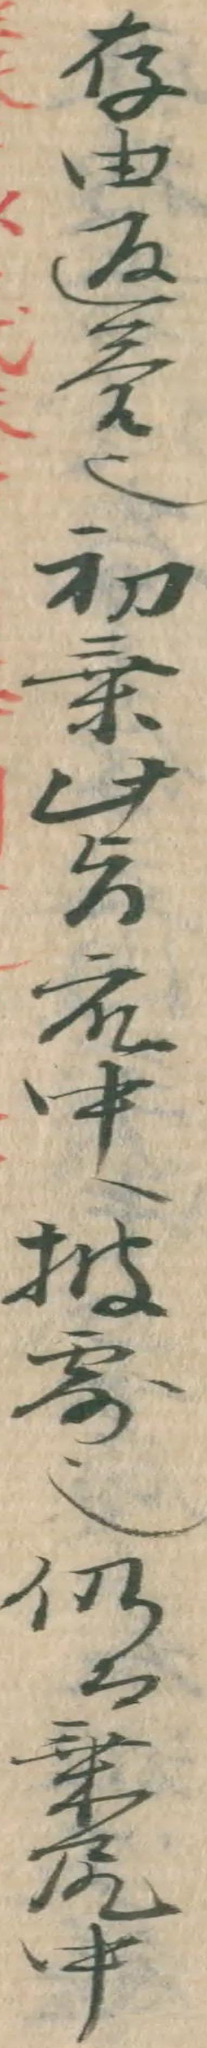存由返答也初乗此旨衆中ヘ披露也仍而乗尻中
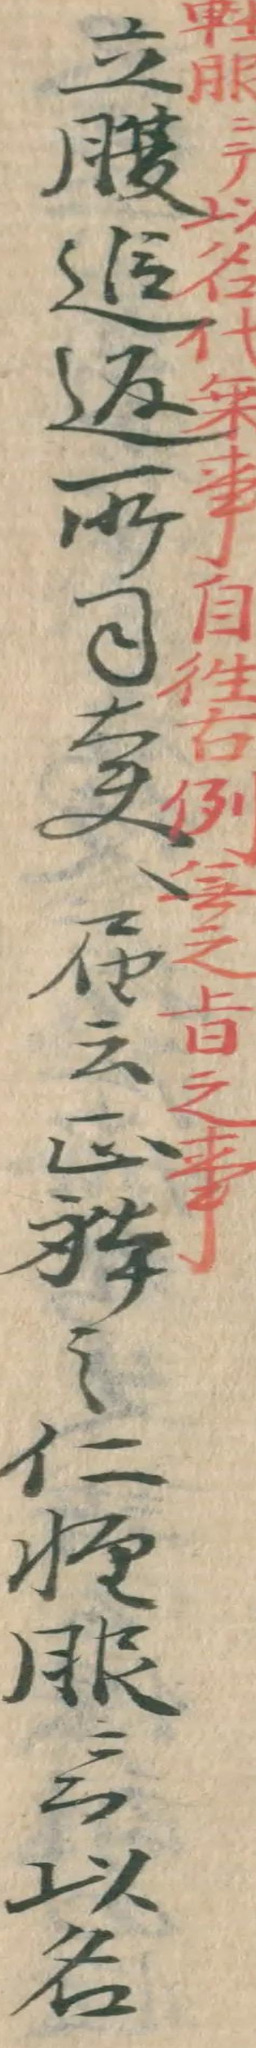立腹追返所司大夫へ届云正体之仁軽服ニ而以名
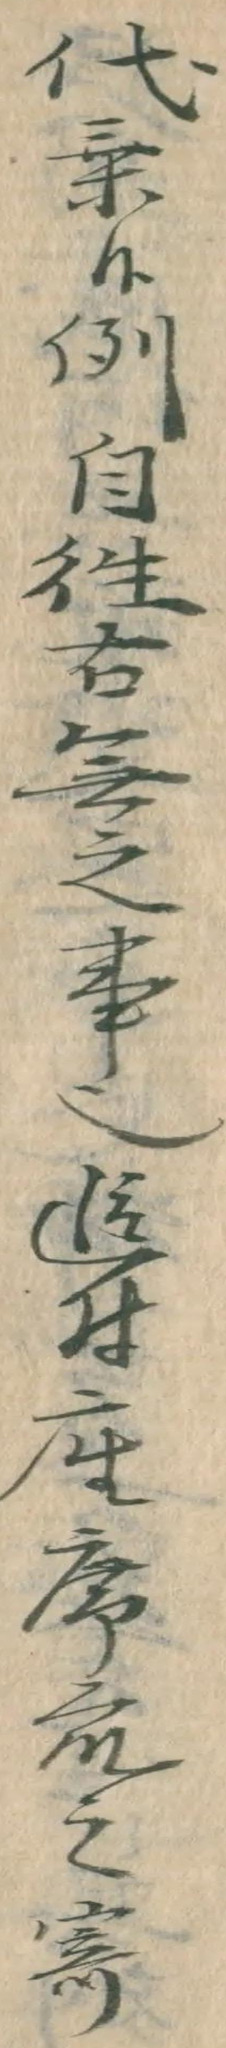代乗候例自往古無之事也追付座席衆之寄
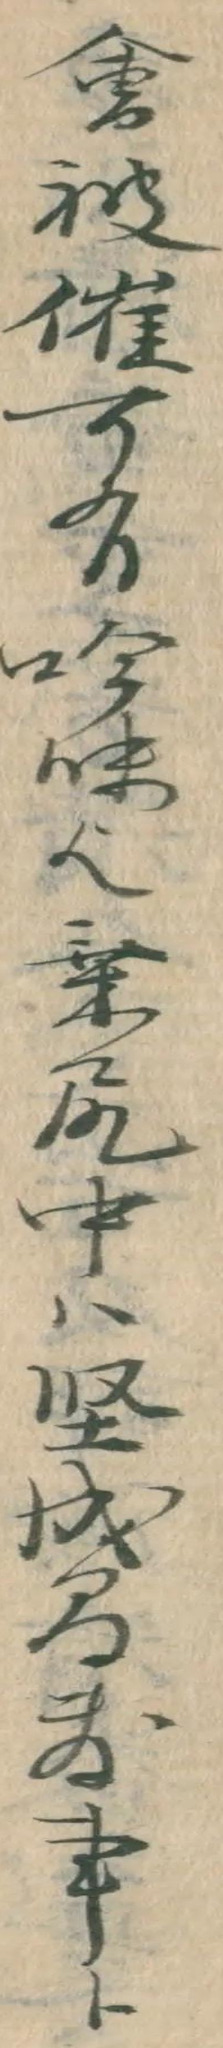会被催可有吟味也乗尻中ハ堅成間敷事ト
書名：賀茂社記録. 第10冊
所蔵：国立国会図書館 National Diet Library, JAPAN
